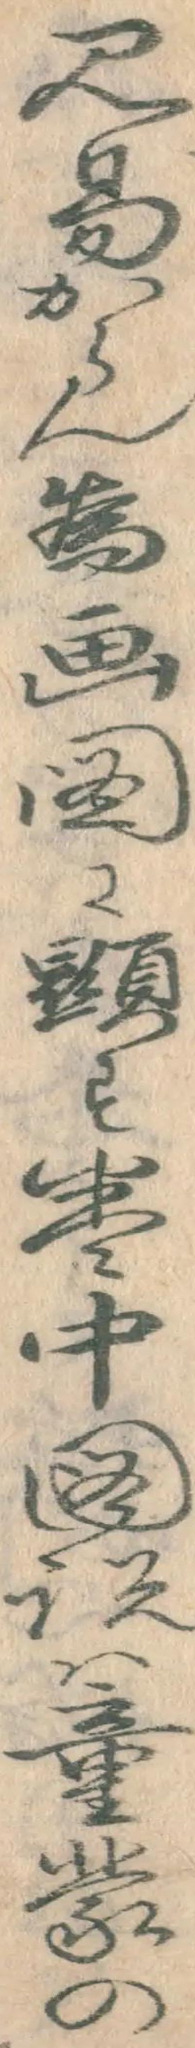見易からん為画図に顕す巻中図説は童蒙の

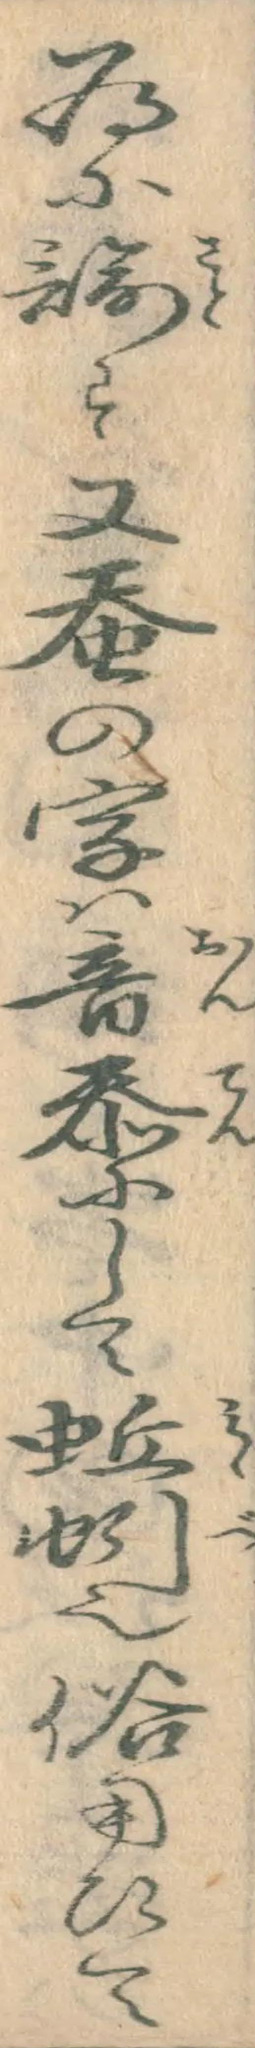為に諭す又蚕の字は音忝にして蚯蚓也俗用ひて
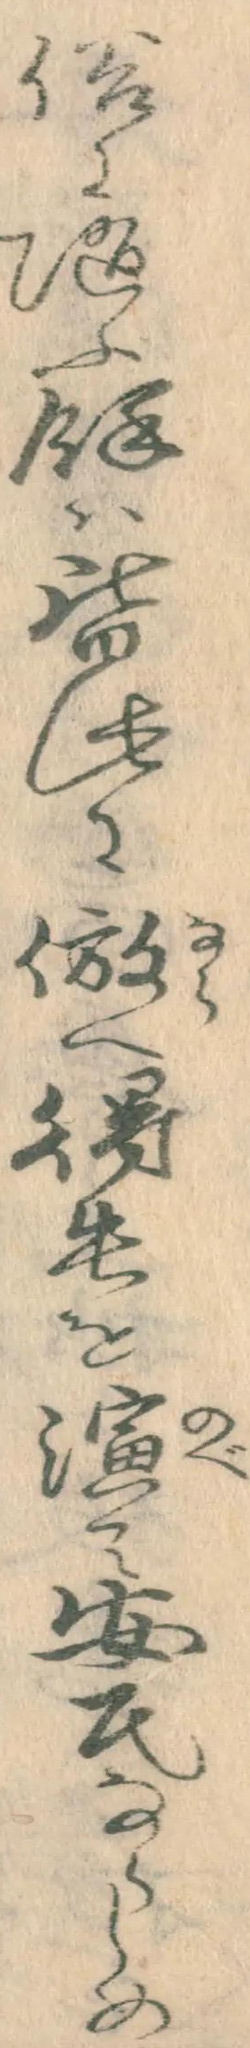俗に随ふ余は皆此に倣へ得失を演て安民ならしめ
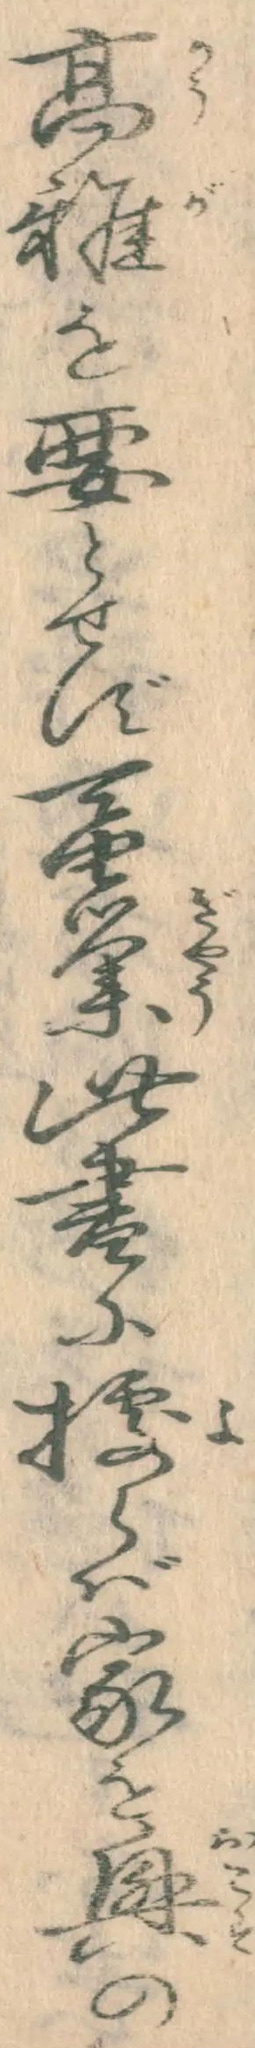高雅を要とせず蚕業此書に拠らば家を興の
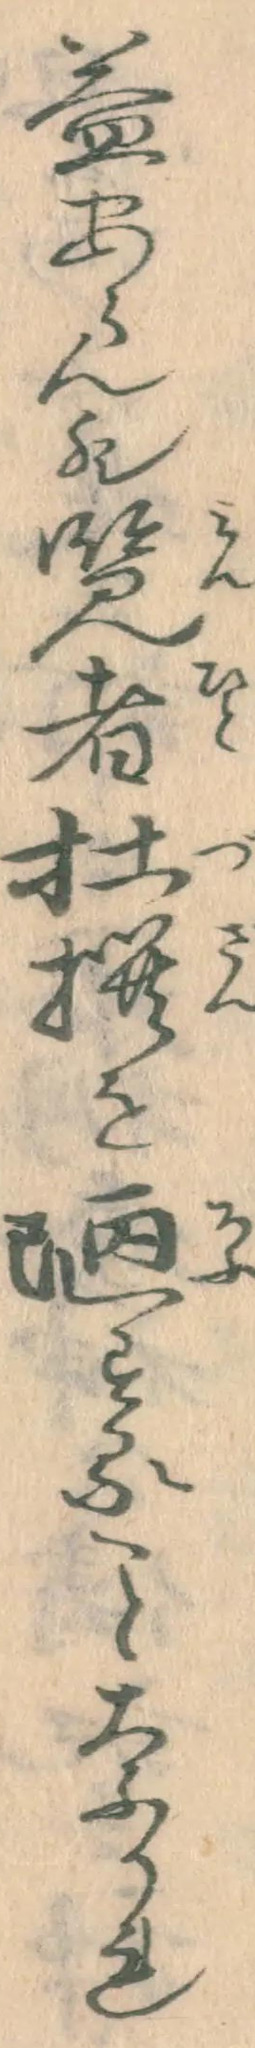益あらん歟覧者杜撰を陋することなかれ
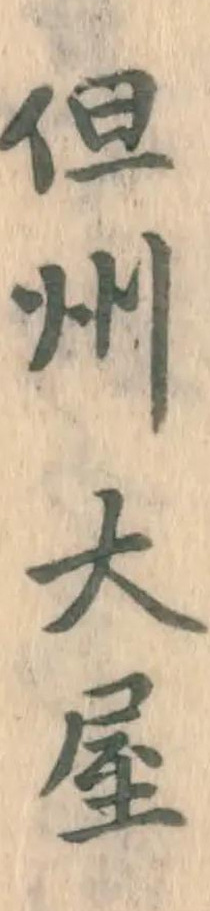但州大屋
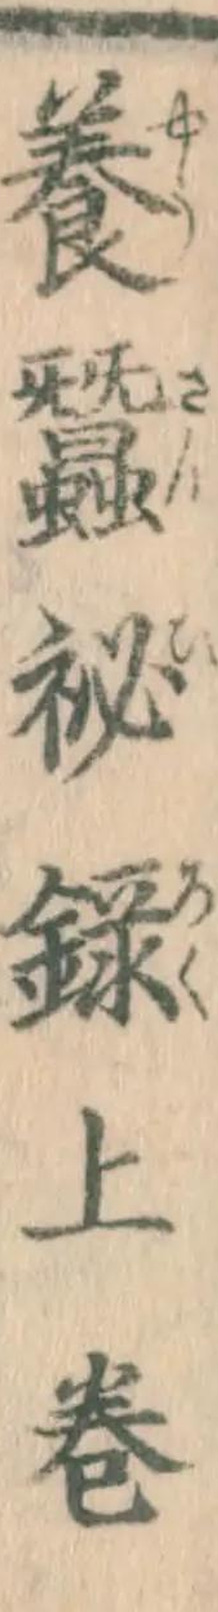養蚕秘録上巻
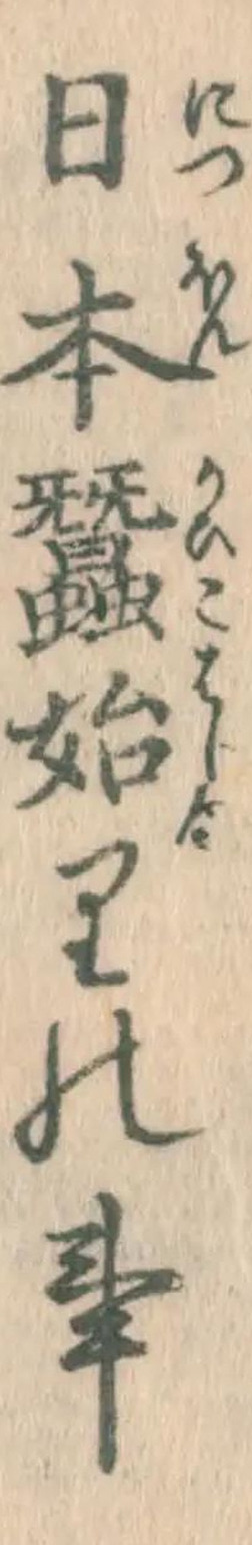日本蚕始りの事
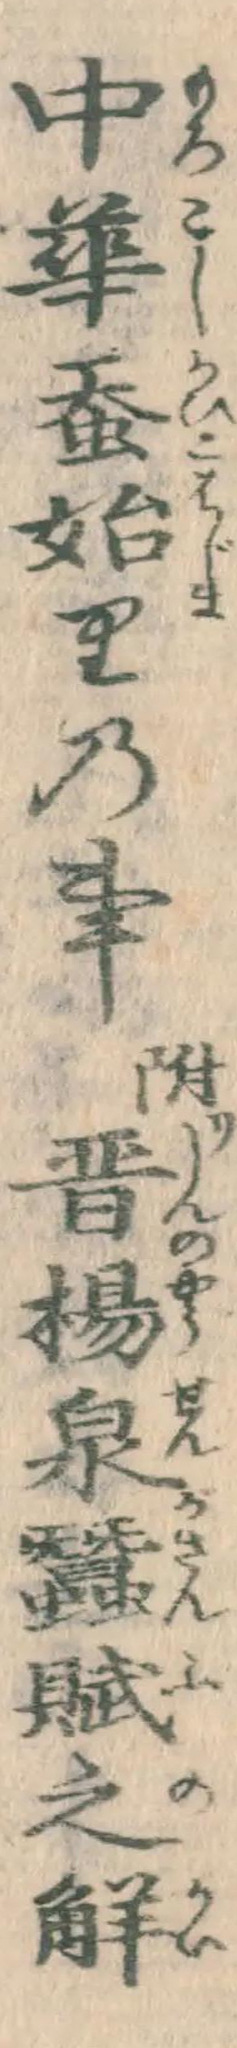日本蚕始りの事
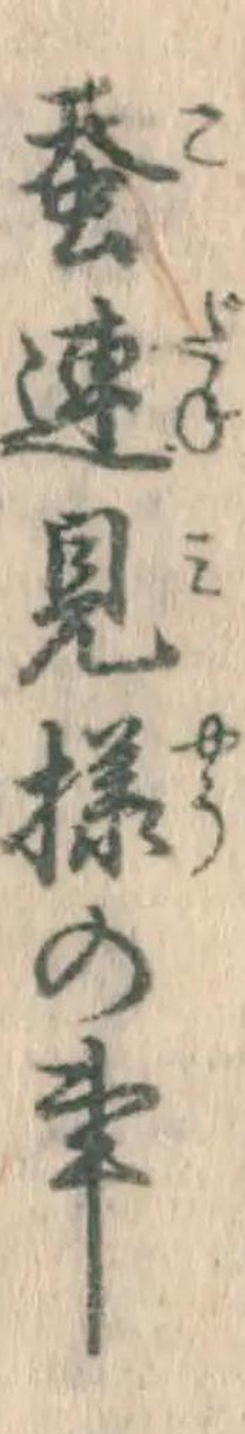蚕連見様の事
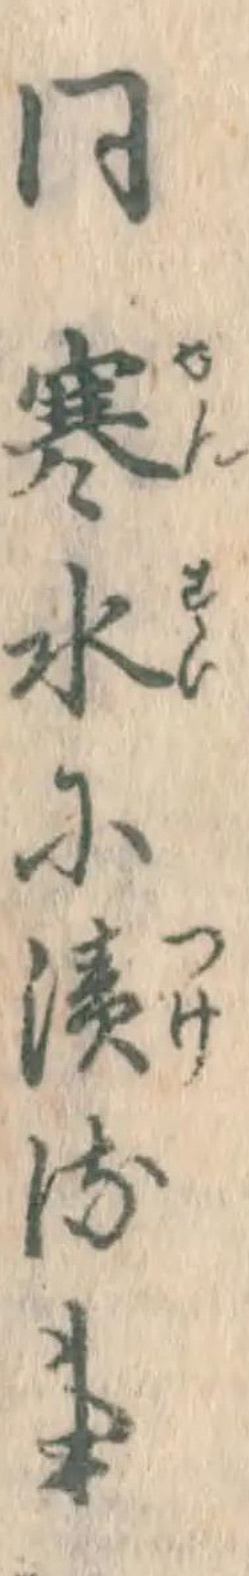同寒水に漬る事
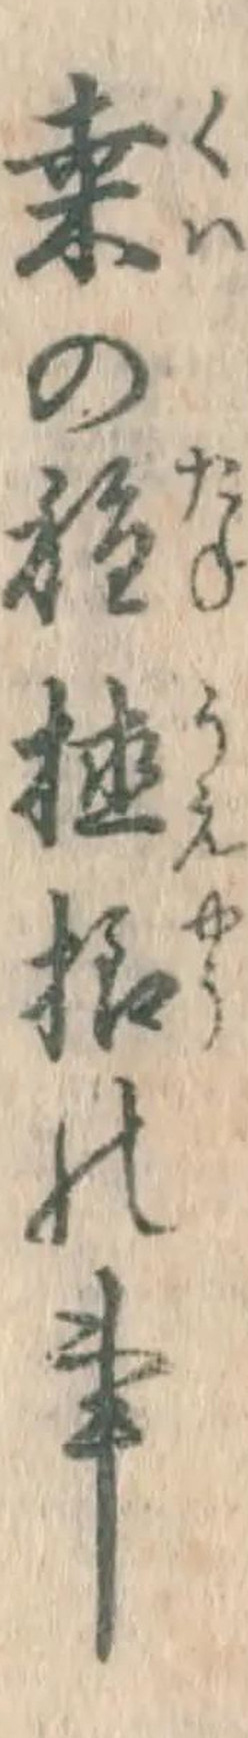桑の種植様の事
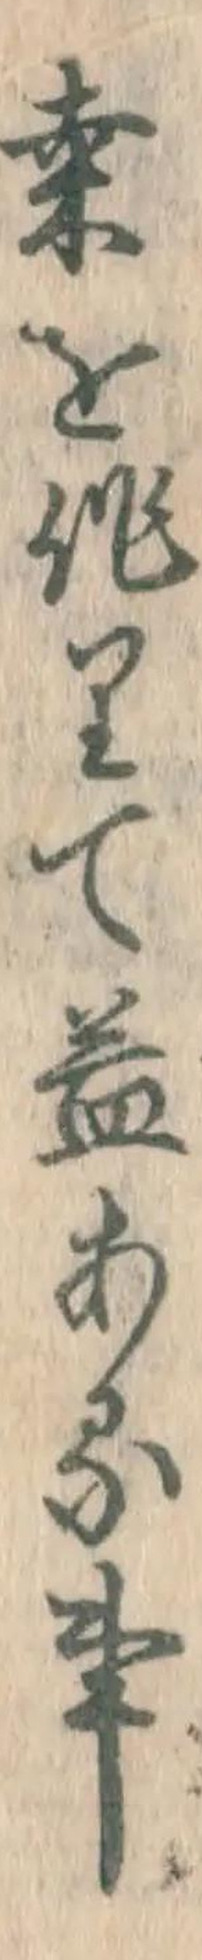桑を作りて益ある事

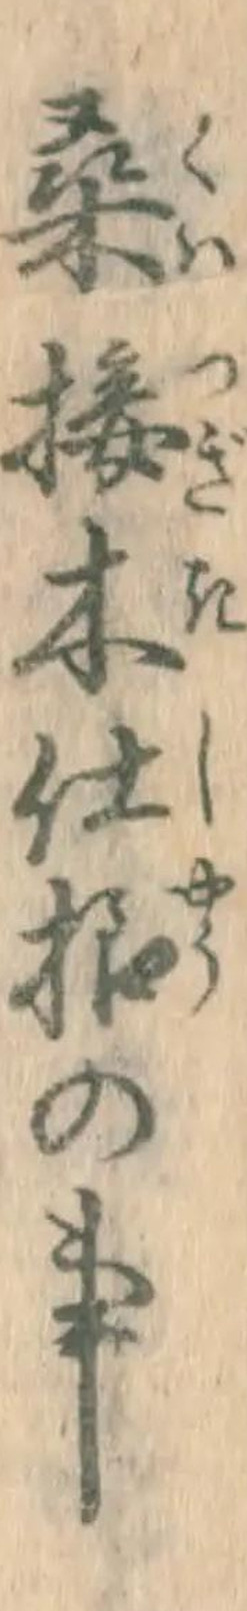桑接木仕様の事
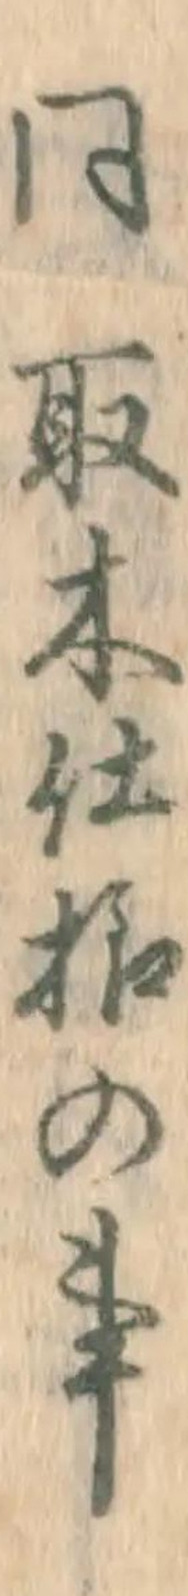同取木仕様の事
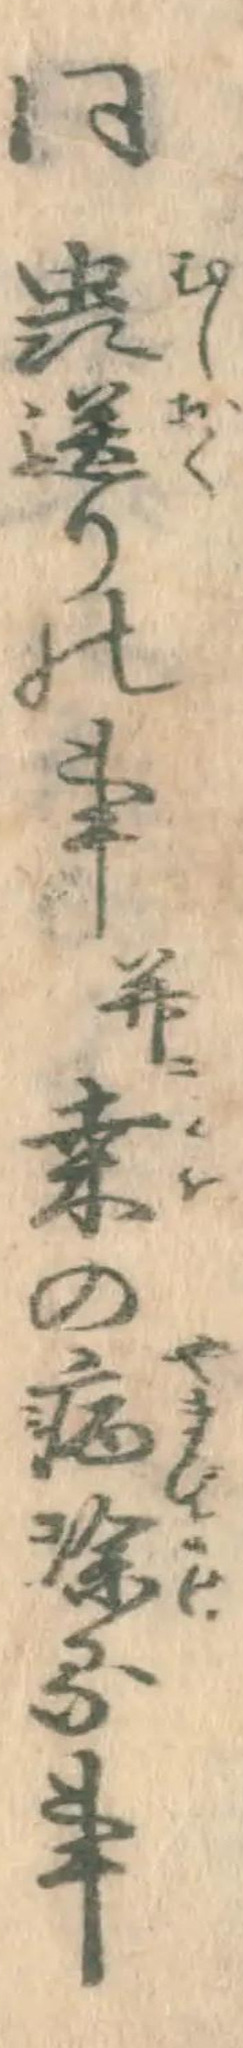同虫送りの事并に桑の病除る事
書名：養蚕秘録 3巻. [1]
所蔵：国立国会図書館 National Diet Library, JAPAN
